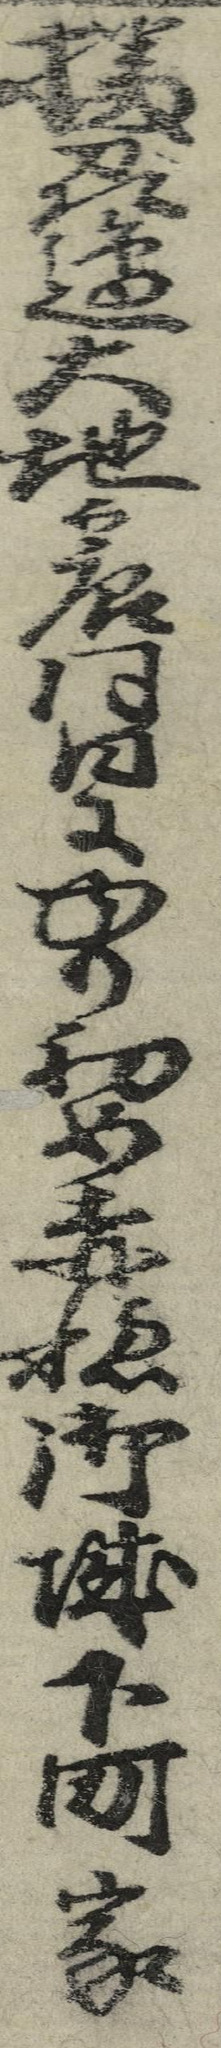播州辺大地震同日にゆり初め赤穂御城下町家
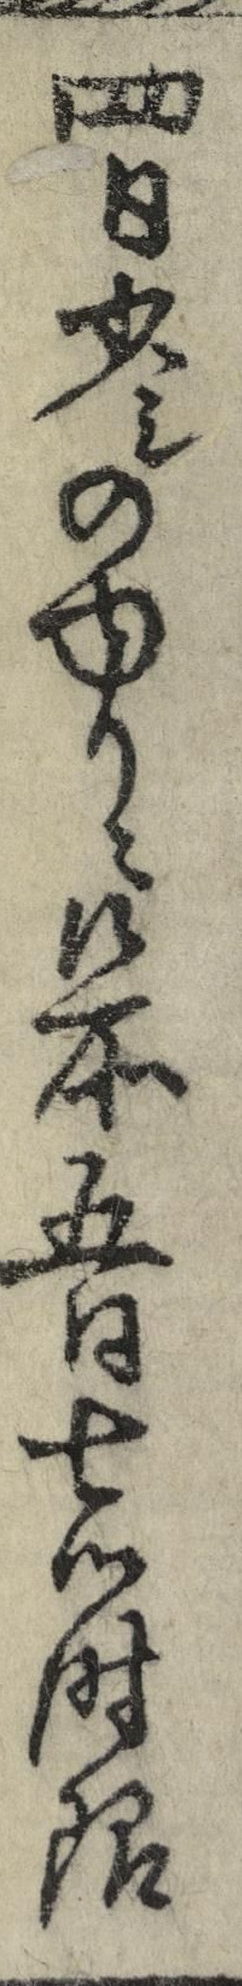四日少シのゆりニ候所五日七ッ時限
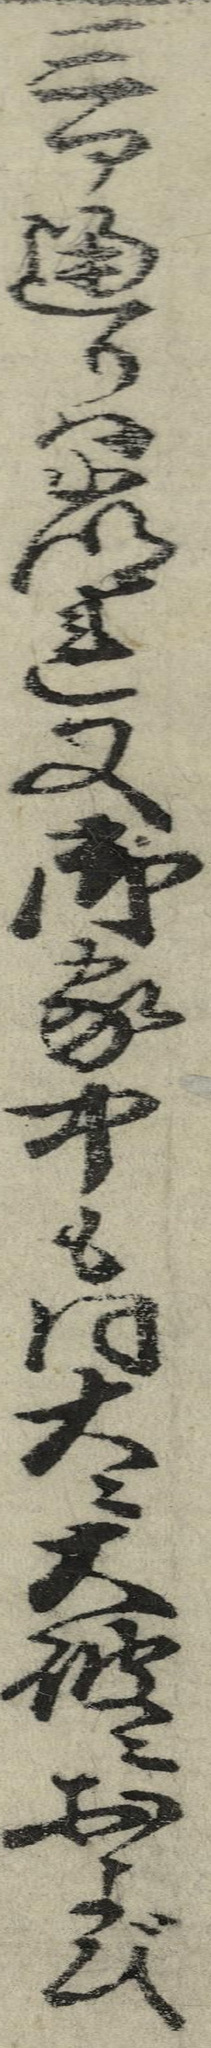三部通りハ崩れ又御家中も同大ニ大破ニおよび
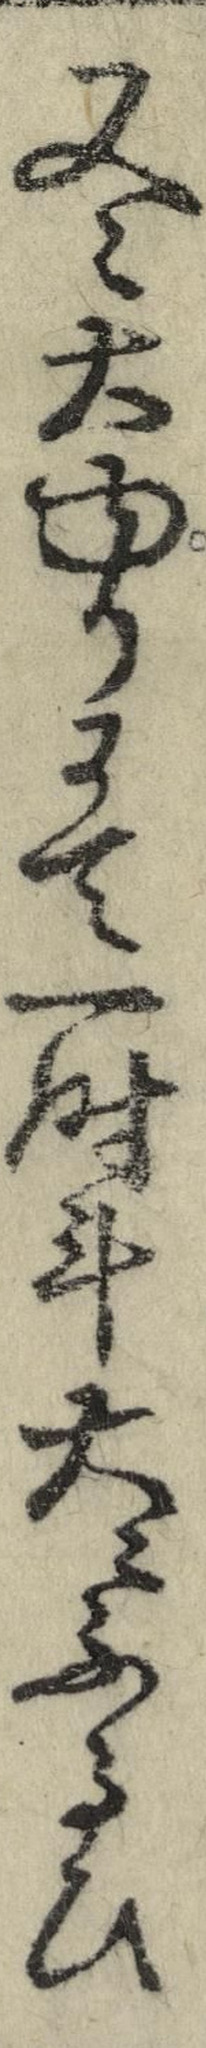又々大ゆりにて一時斗大ニふるひ
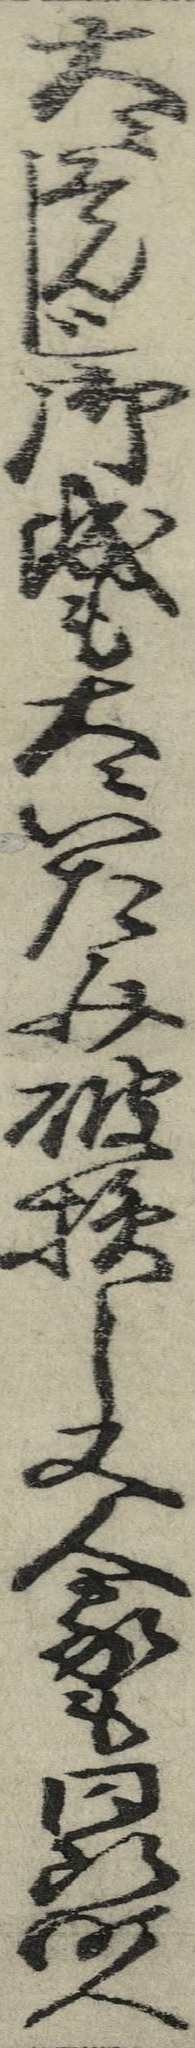大ニそんじ御城も大ニいたみ破損し又人家も同断町人
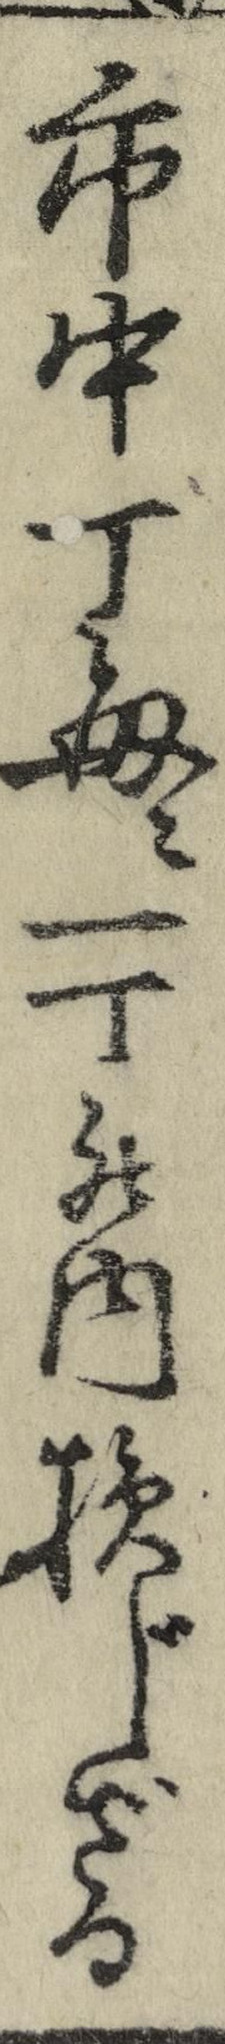市中丁毎ニ一丁の内損じざる
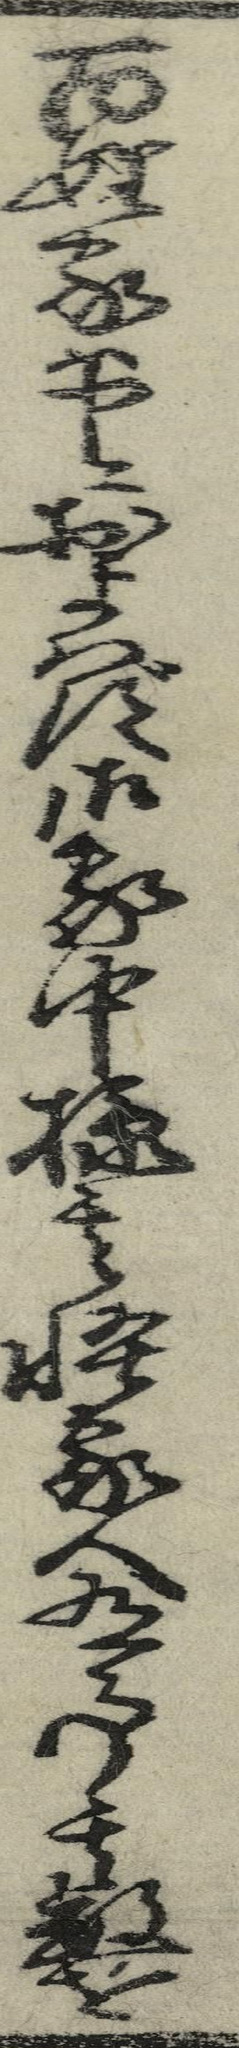百姓家筆ニおよハず御家中様其怪我人有事其数を
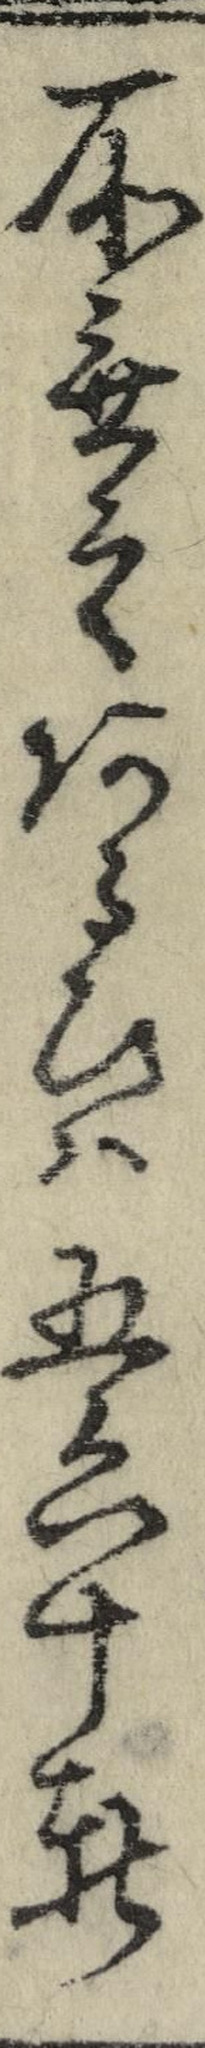所無之あるひㇵ五六十軒
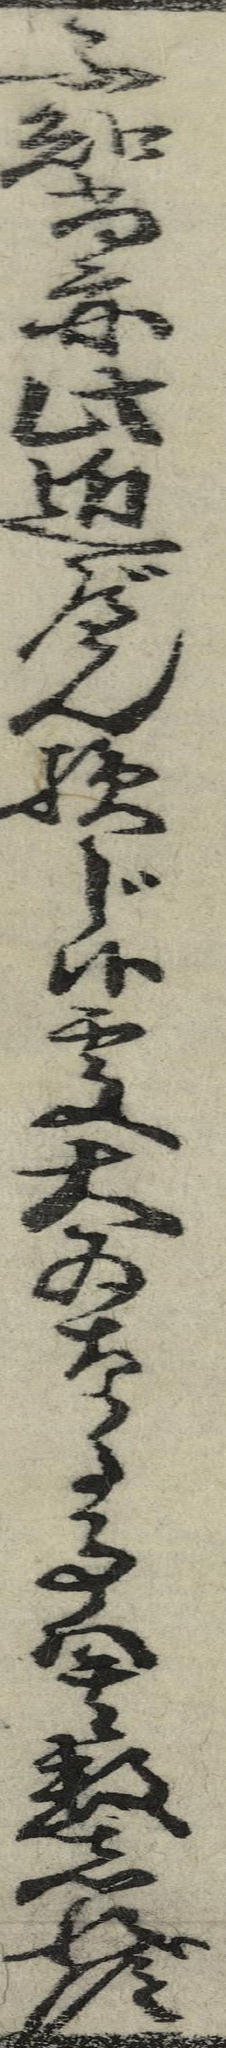不知尚亦此近べん損じ候処大いなる事ハ数しれず
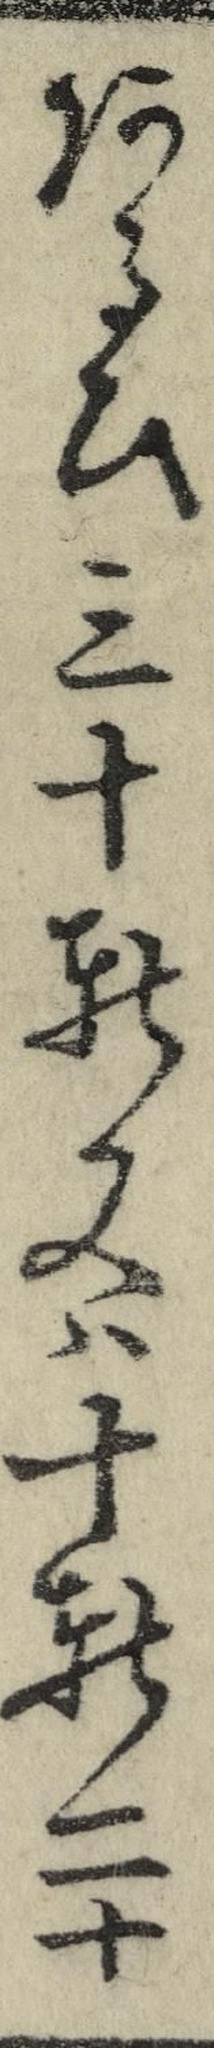あるひ三十軒又ㇵ十軒二十
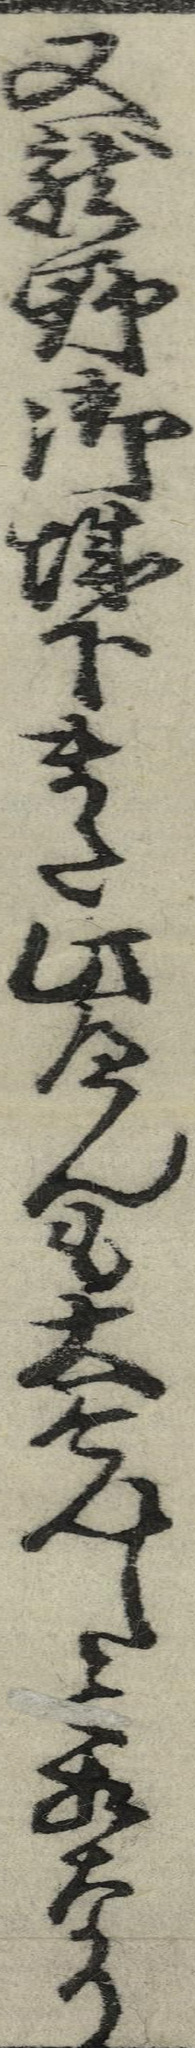又龍野御城下また此へんも大そんじ候所なり
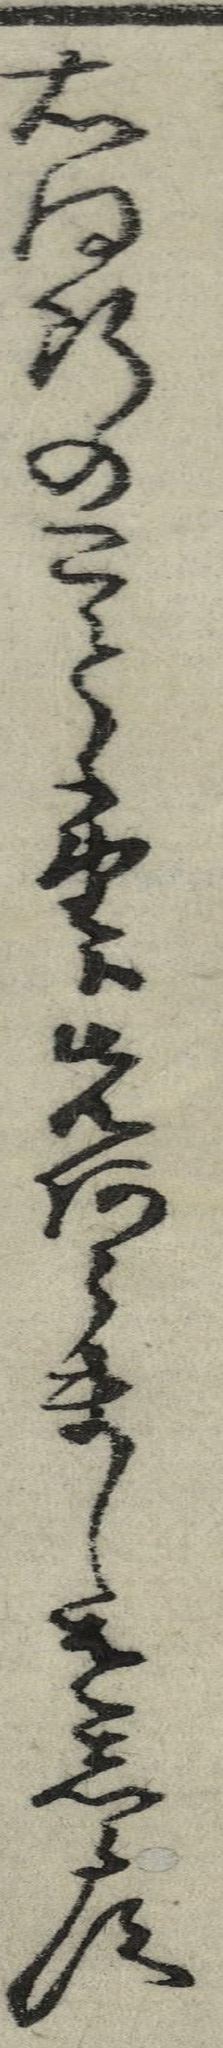右同断のことに御座候先あらましをしるす
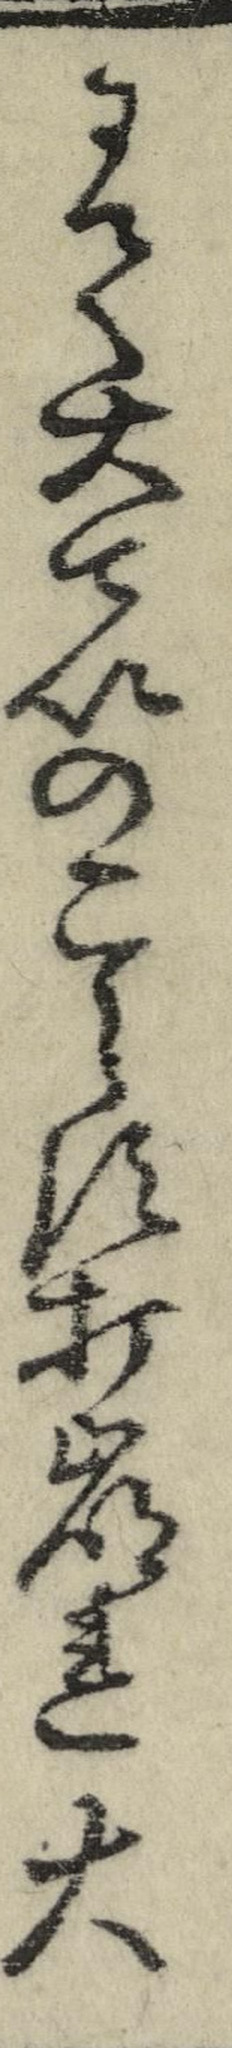まて大ていのこらず打潰れ大
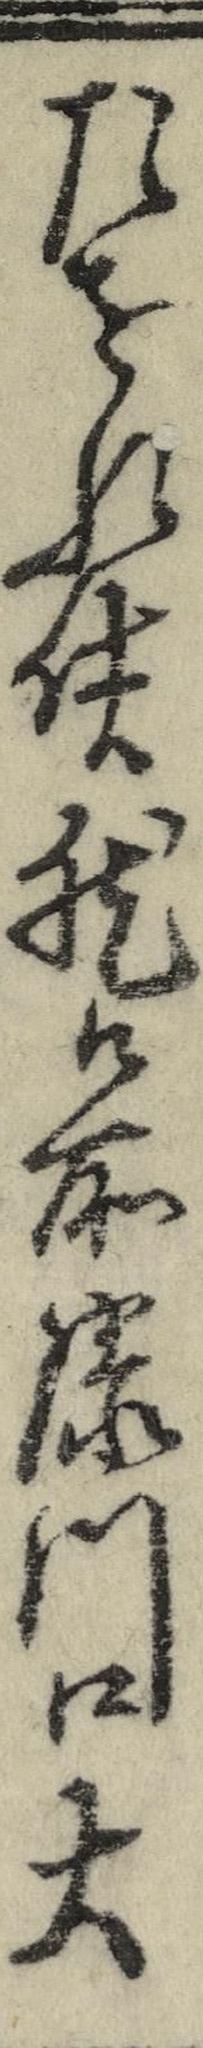たをれ仕候然ル所湊川口大
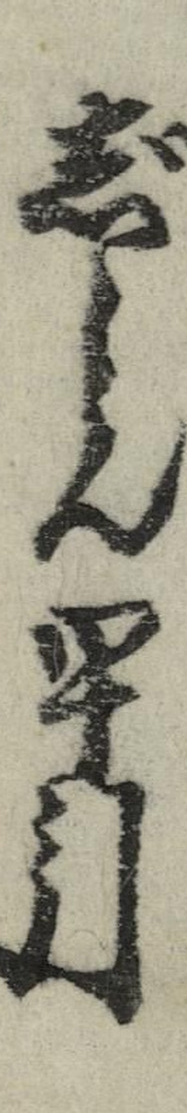じしん早引
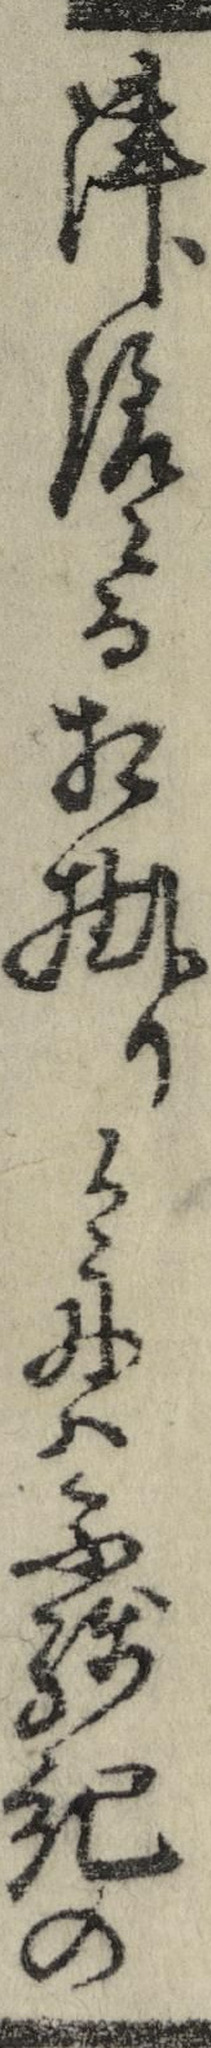津浪ニ而相掛り候舟ハ不残紀の
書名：[安政東南海地震に関する瓦版]
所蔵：東京大学地震研究所図書室 Earthquake Research Institute Library, The University of Tokyo, JAPAN
